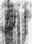鈲（壺）
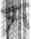四
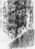才（在）
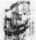{匚去}
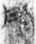{阝咸}
